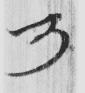乃
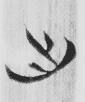出
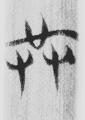共
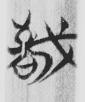{苟戈}
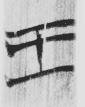王
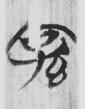{宀孫}
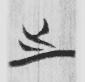之
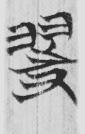{羽寺}
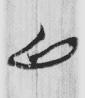㠯（以）
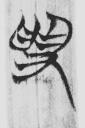受
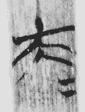夫=
